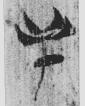干（諫）
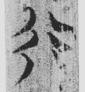行
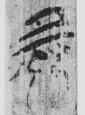而
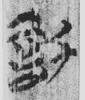信
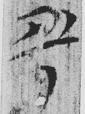先
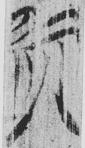凥（處）
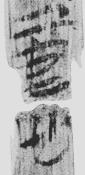忠
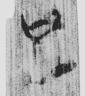也
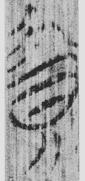貧
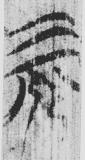而
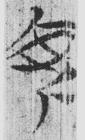安
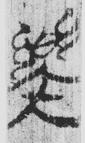樂
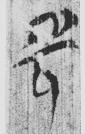先
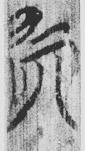凥（處）
